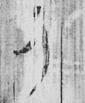人
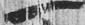一
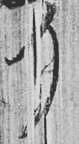人
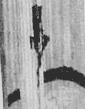土（杜）
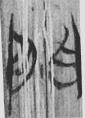門
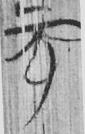而
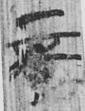不
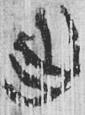出
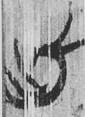此
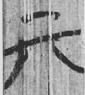亓（其）
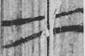二
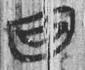回
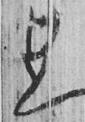也
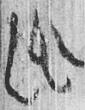州
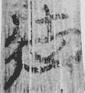徒
